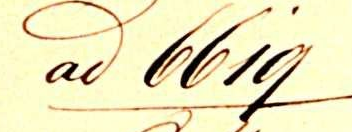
ad 6619
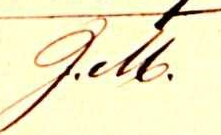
J.M.
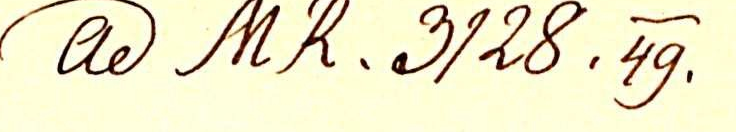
ad MR 3128/49
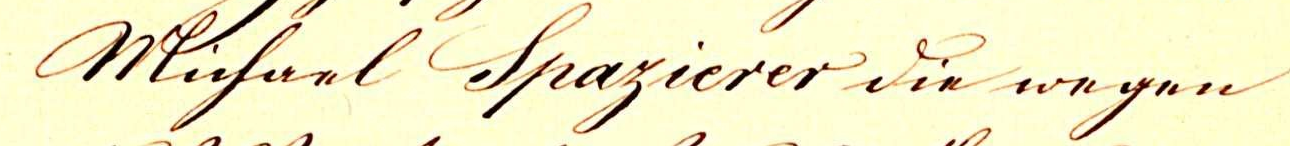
Michael Spazierer die, wegen
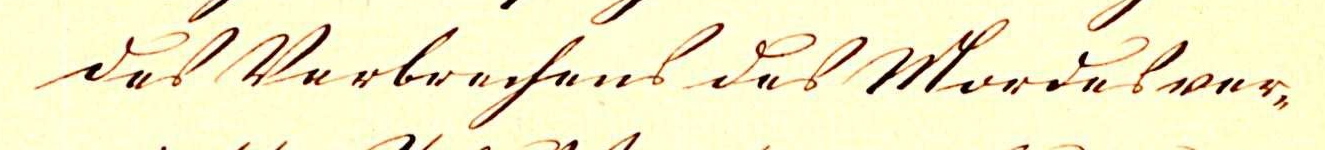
des Verbrechens des Mordes ver¬
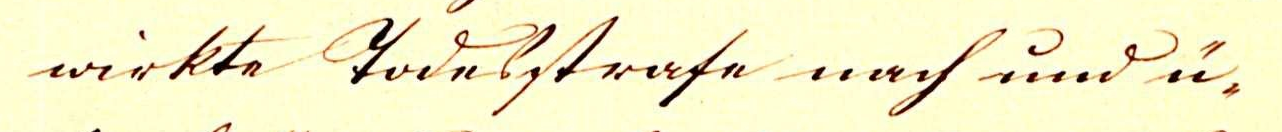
wirkte Todesstrafe nach und ü¬
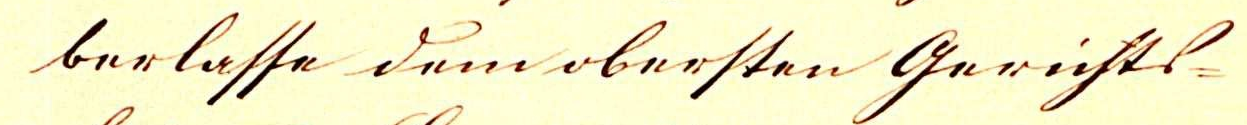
berlasse dem obersten Gerichts¬
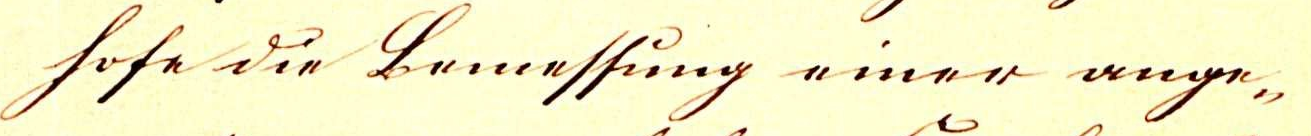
hofe die Bestimmung einer ange¬
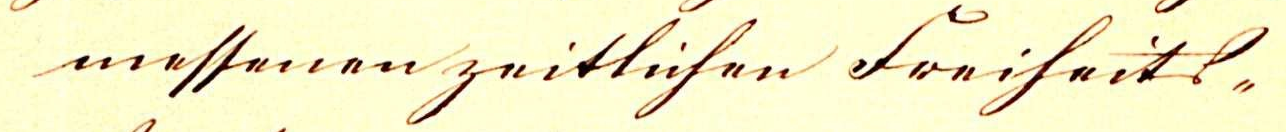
messenen zeitlichen Freiheits¬
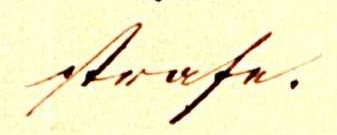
strafe.
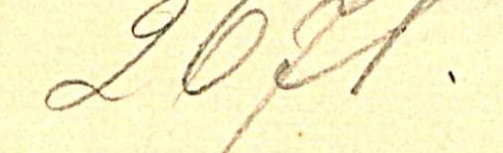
2671
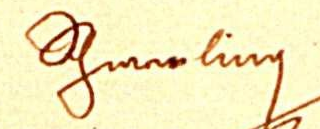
Schmerling
